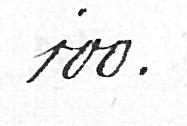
100.
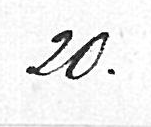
20.
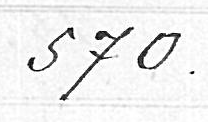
570.
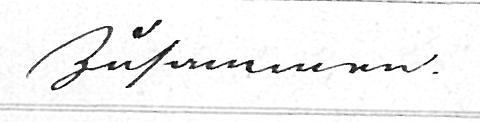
Zusammen
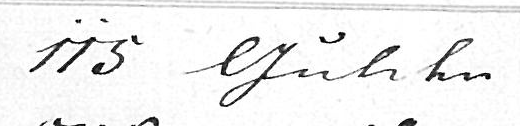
115 Gulden
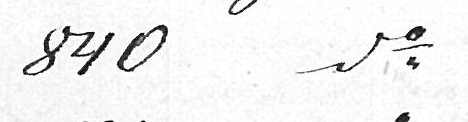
840 do.
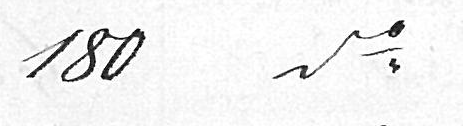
180 do.
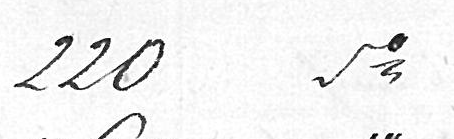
220 do.
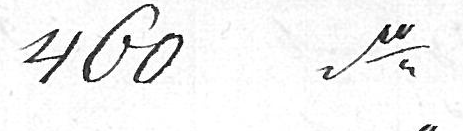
460 do.
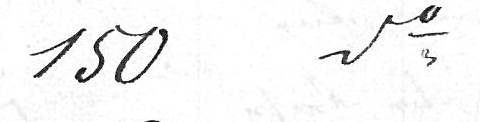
150 do.
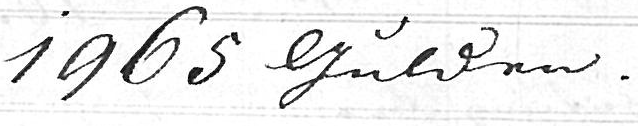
1965 Gulden
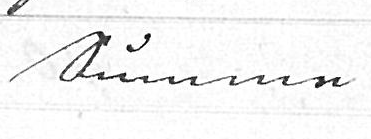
Summe
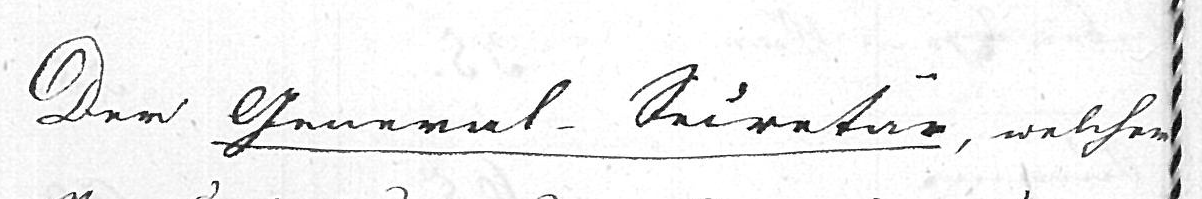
Der General-Secretär, welcher
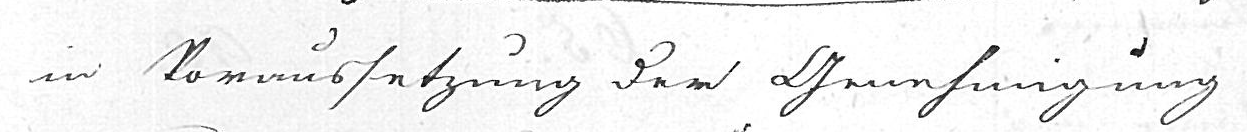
in Voraussetzung der Genehmigung
